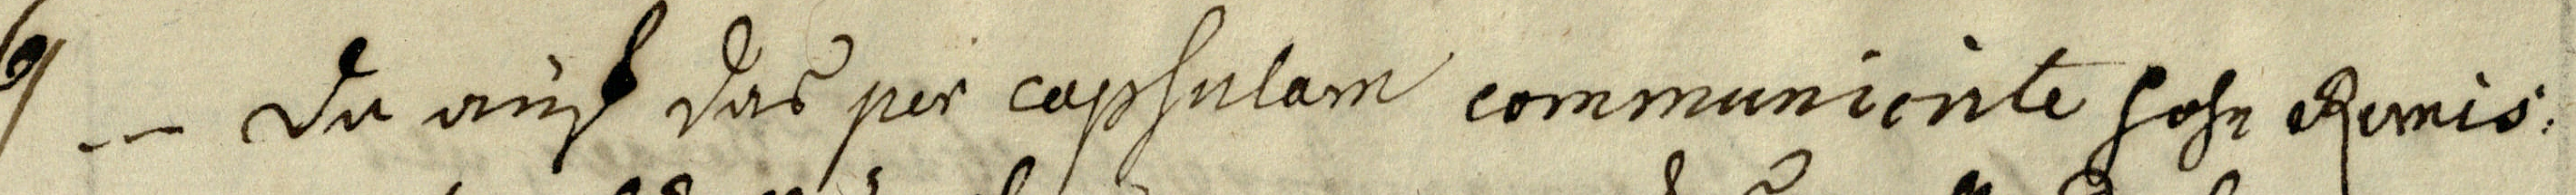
6. Da auf das per capsulam communicirte hohe Remis¬
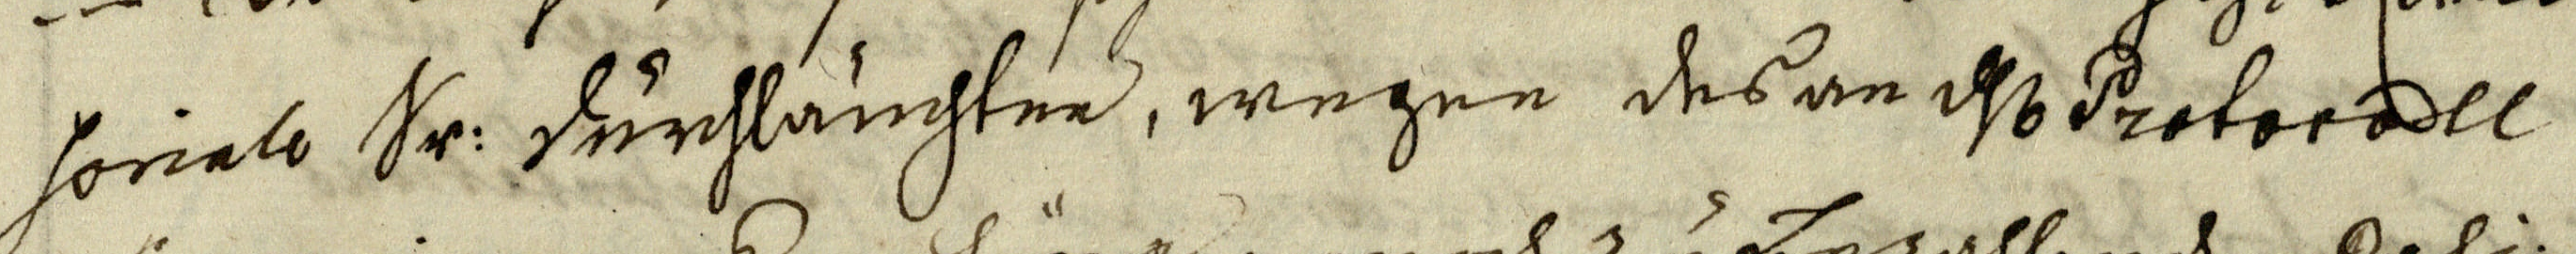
soriale Sr. Durchlauchten, wegen des an dh Protocoll
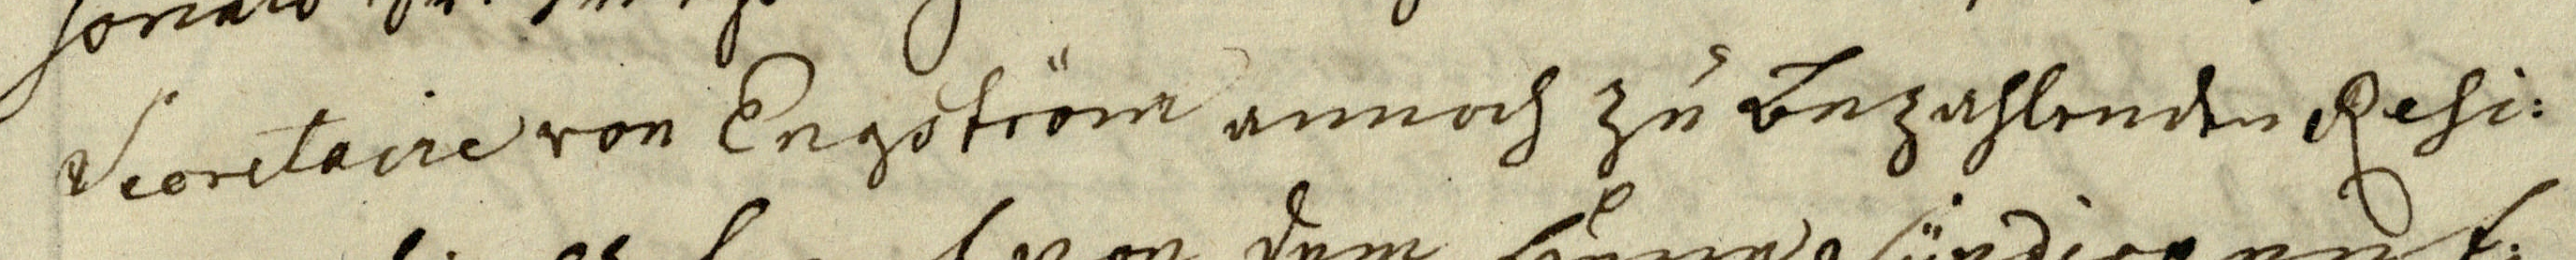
Secretaire von Engström annoch zu bezahlende Resi¬
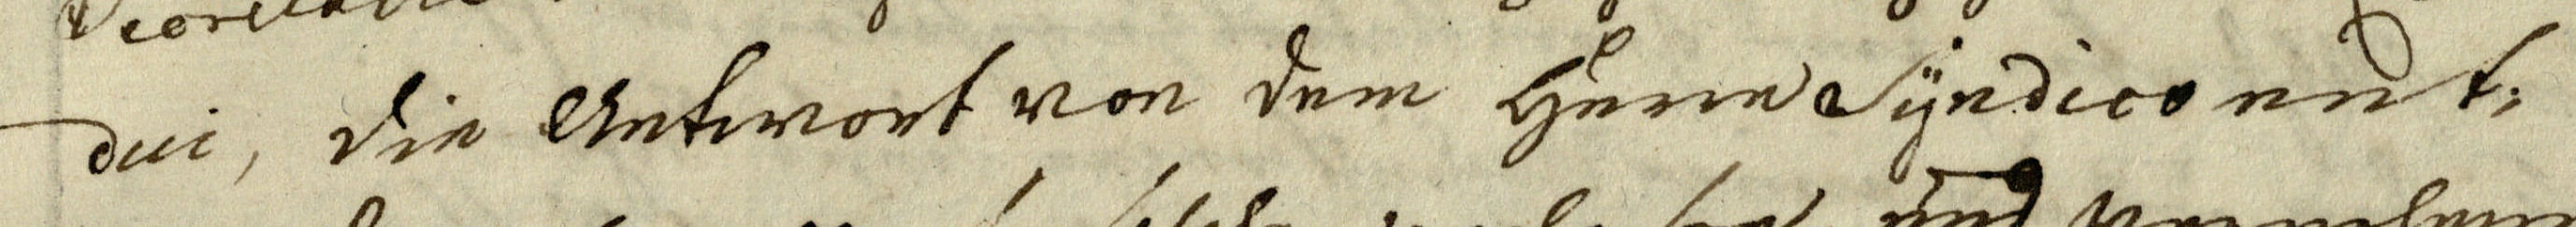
dui, die Antwort von dem Herrn Sÿndico ent¬
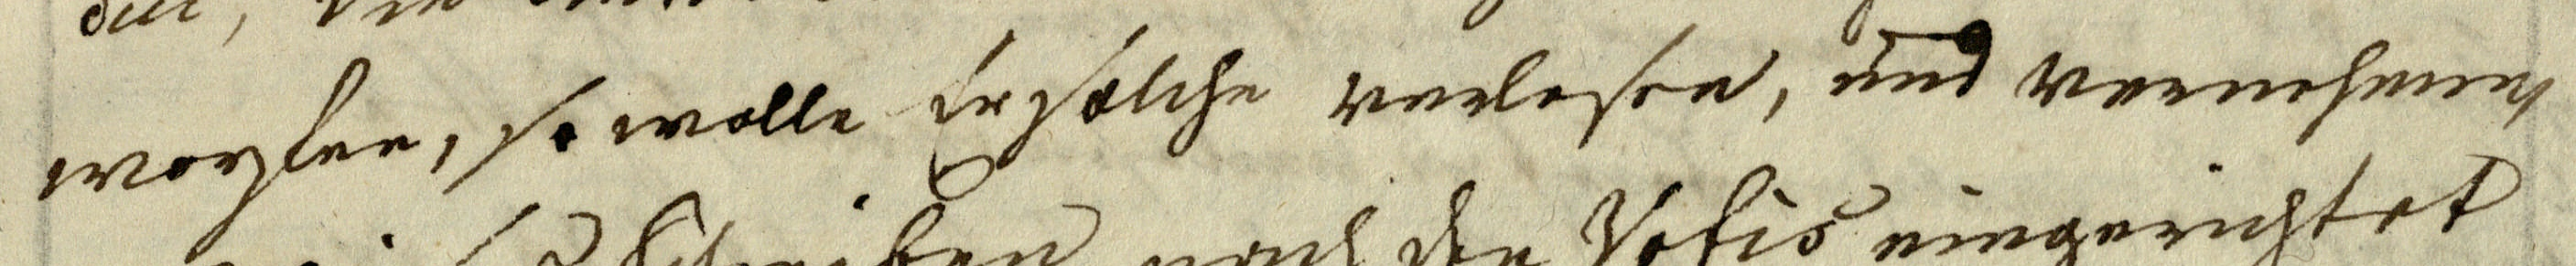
worfen, so wolle Er solche verlesen, und vernehmen,
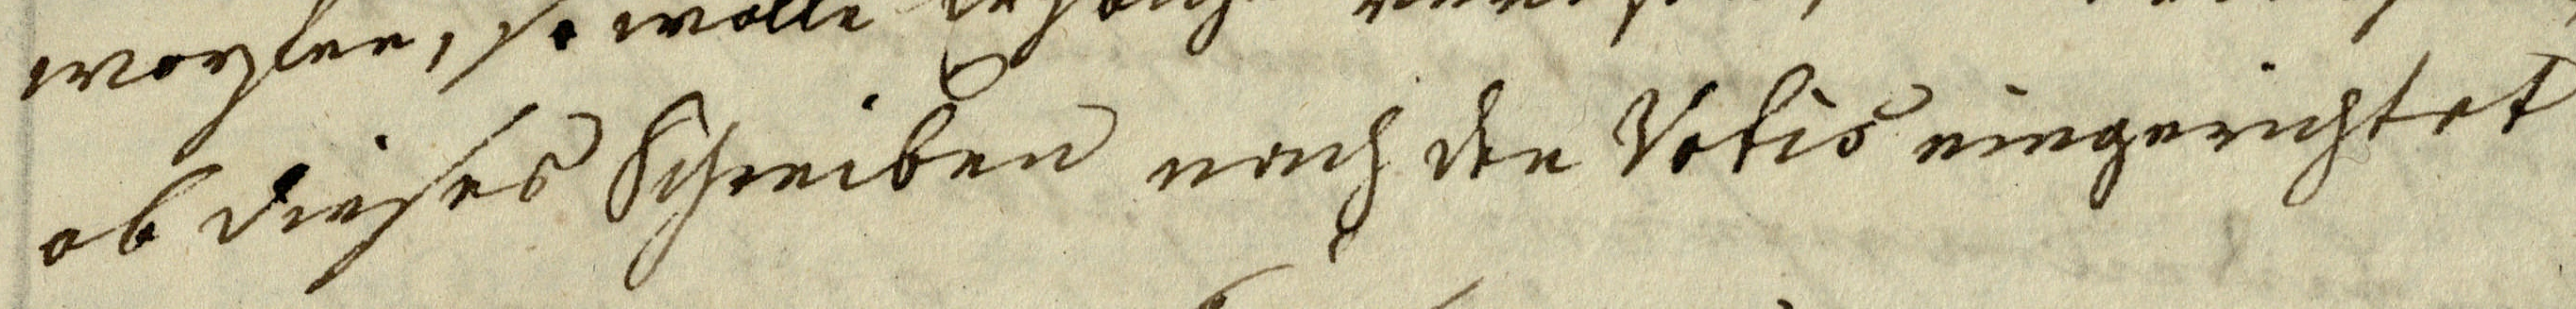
ob dieses Schreiben nach den Votis eingerichtet
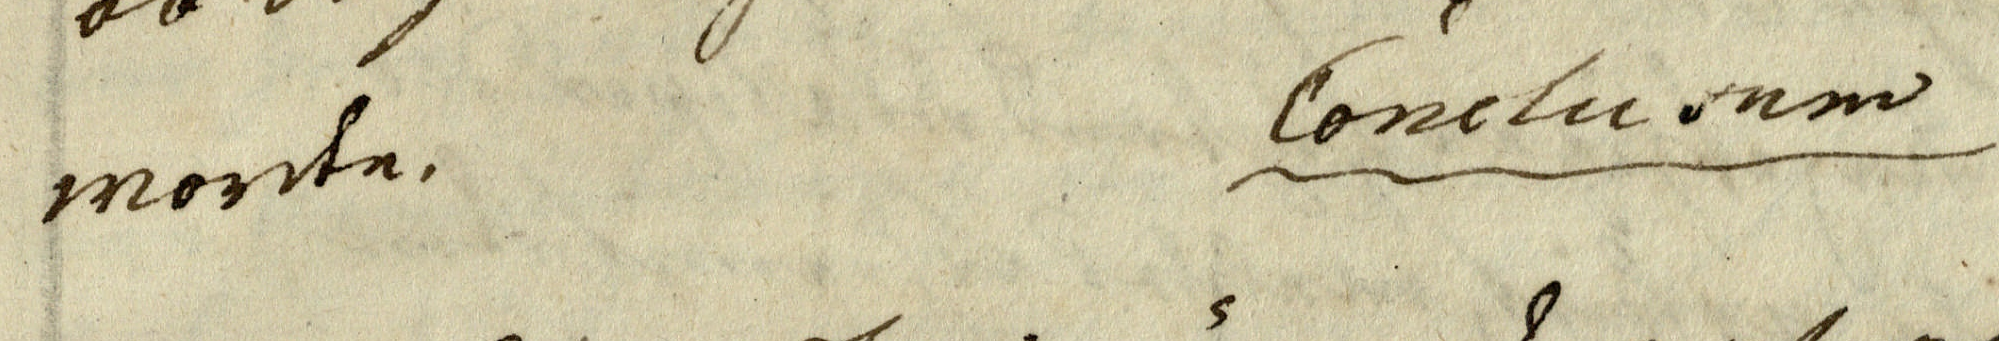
worden. Conclusum
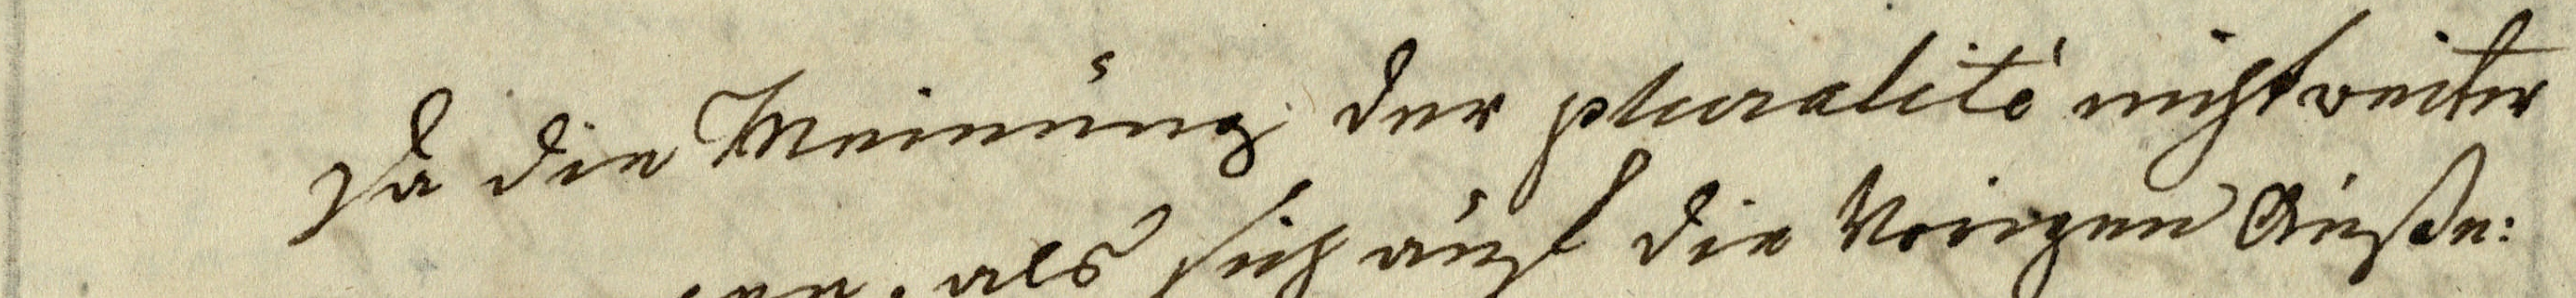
Da die Meinung der pluralitè nicht weiter
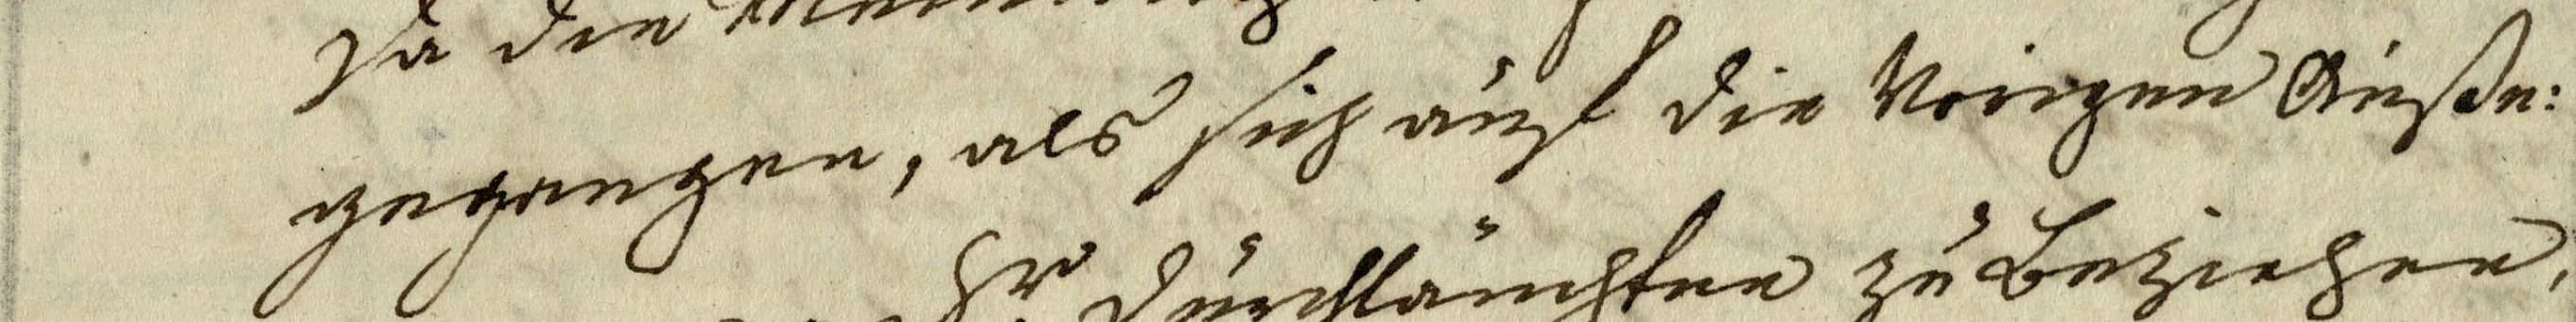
gegangen, als sich auf die vorigen Auße¬
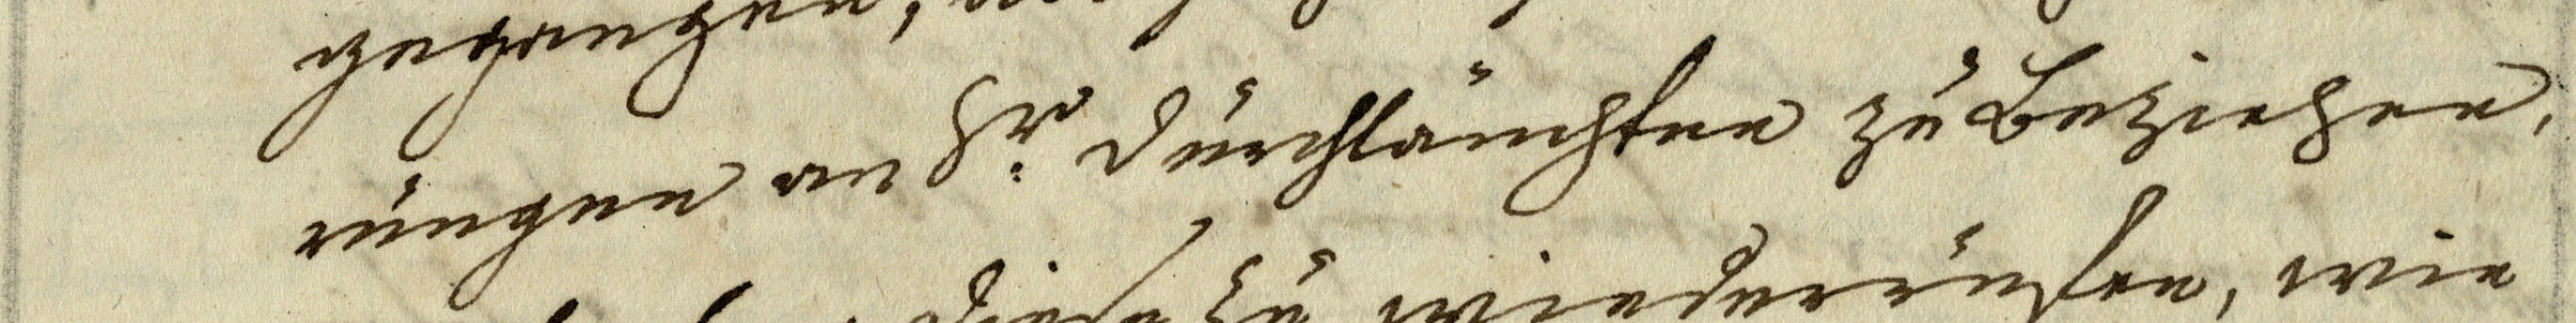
rungen an Sr. Durchlauchten zu beziehen,
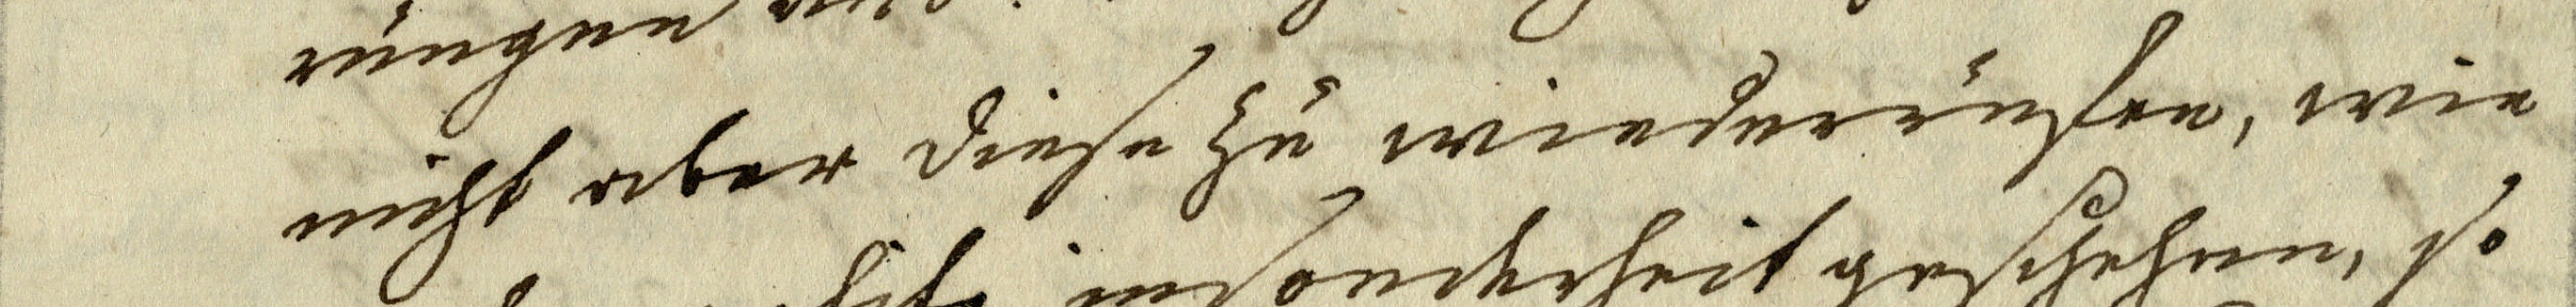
nicht aber diese zu wiederrufen, wie
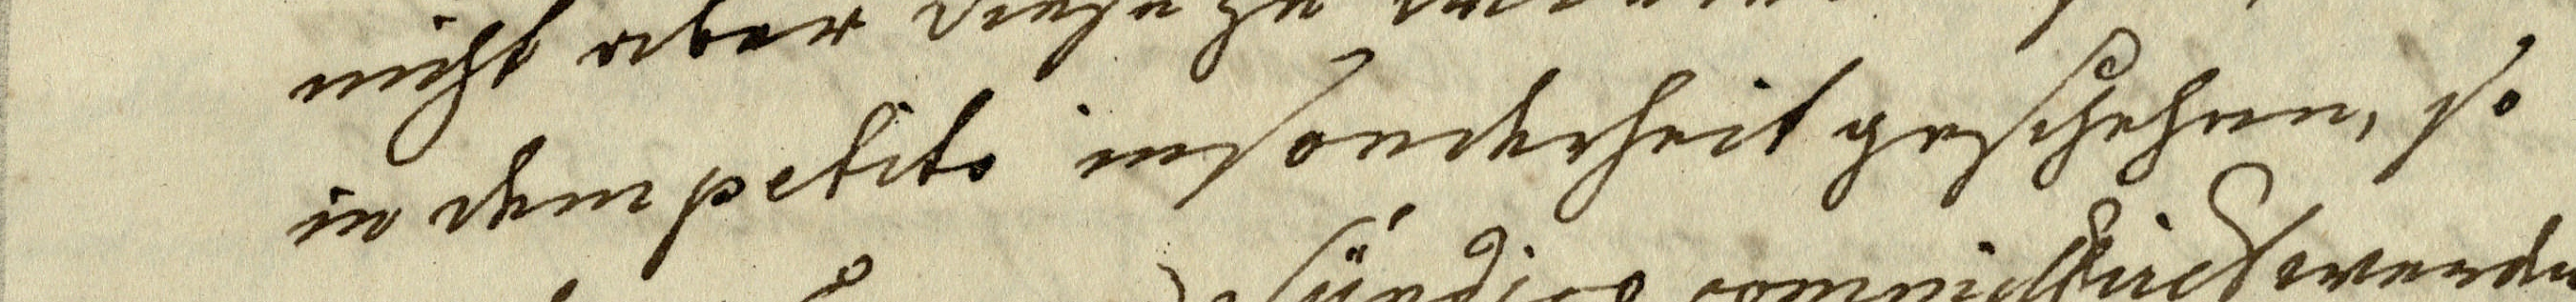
in dem petito insonderheit geschehen, so
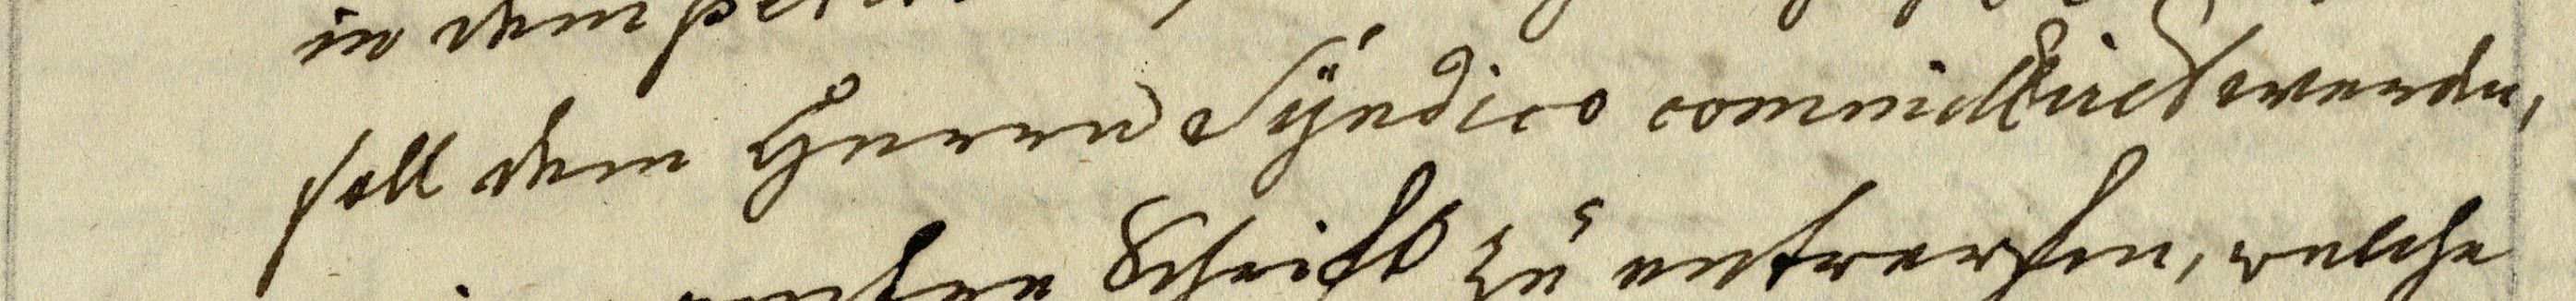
soll dem Herrn Sÿndico committiret werden,
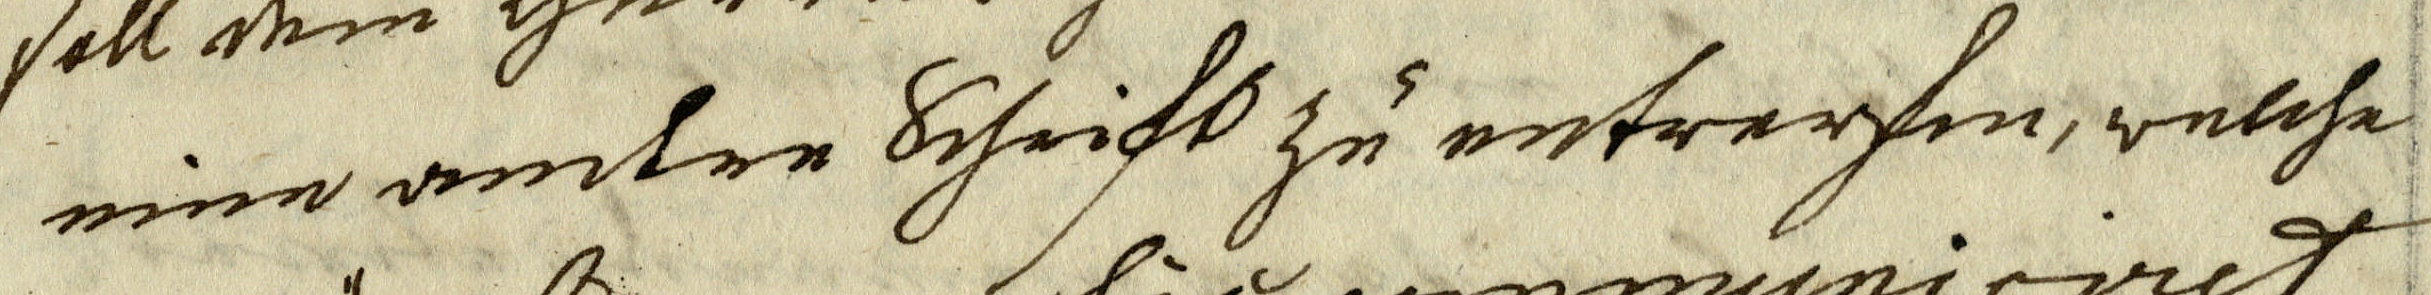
eine andere Schrift zu entwerfen, welche
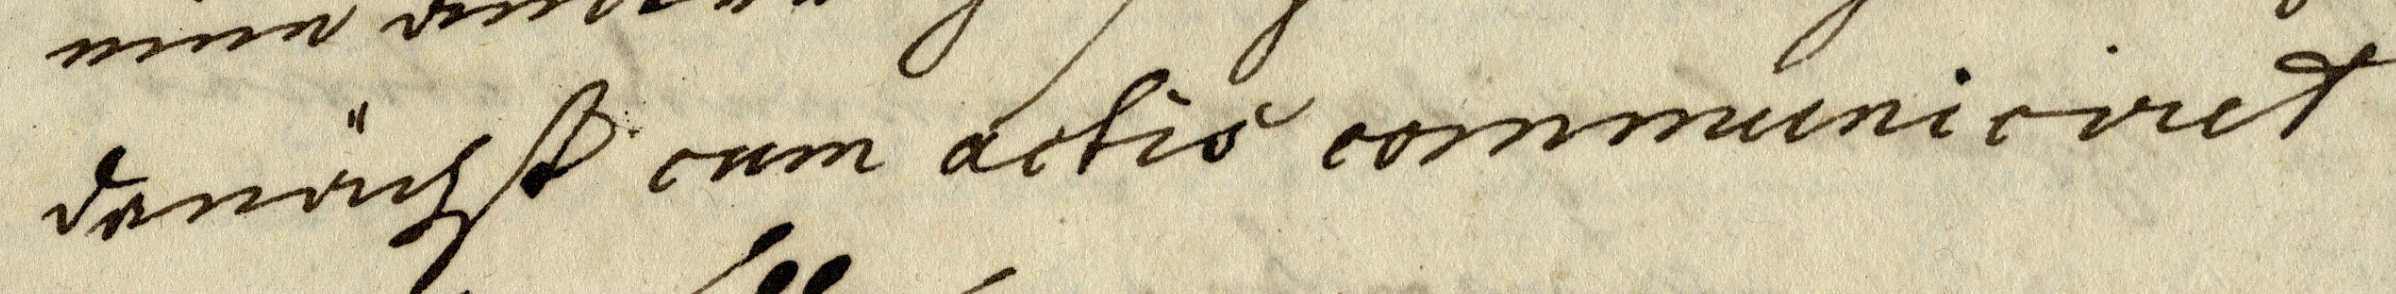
danächst cum actis communiciret
